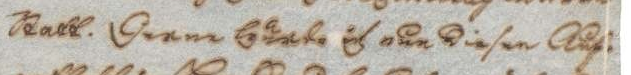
Statt. Gerne würde ich nun diesen Auf-
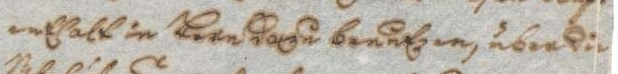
enthalt in Bern dazu benutzen, über die
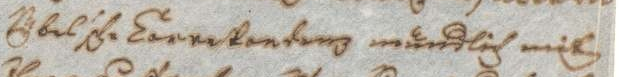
Sybel'sche Correspondenz mündlich mit
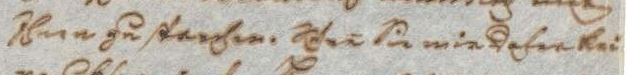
Ihnen zu sprechen. Wenn Sie mir daher kei-
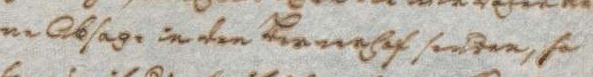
ne Absage in den Bernerhof senden, so
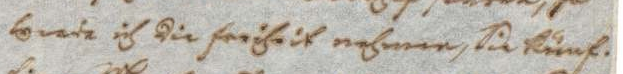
werde ich die Freiheit nehmen, Sie künf-
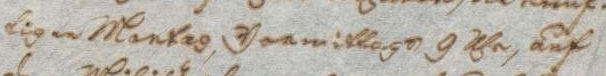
tigen Montag, Vormittags 9 Uhr, auf
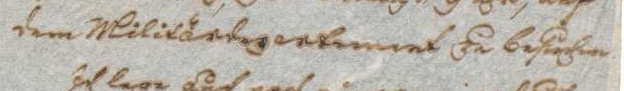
dem Militärdepartement zu besuchen.
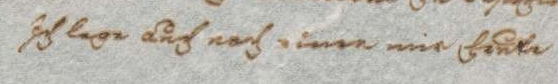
Ich lege auch noch einen mir heute
